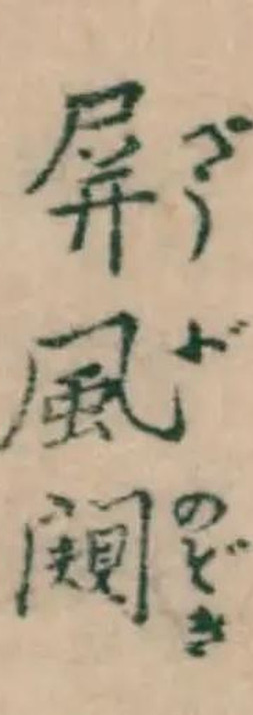屏風闚
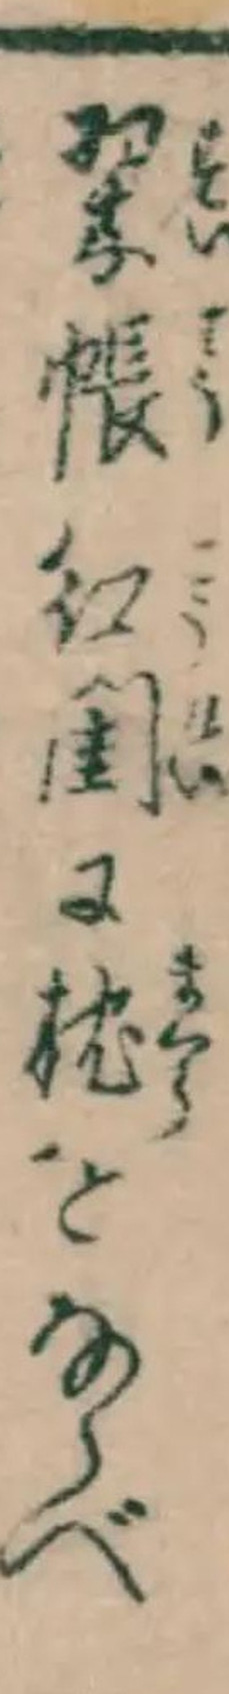翠帳紅閨に枕をならべ
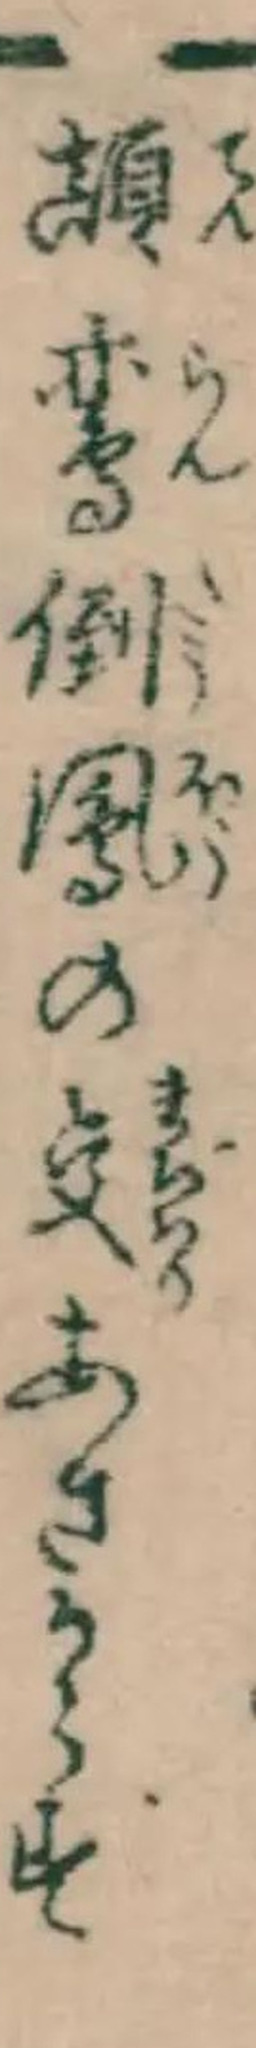顛鸞倒鳳の交あさからず
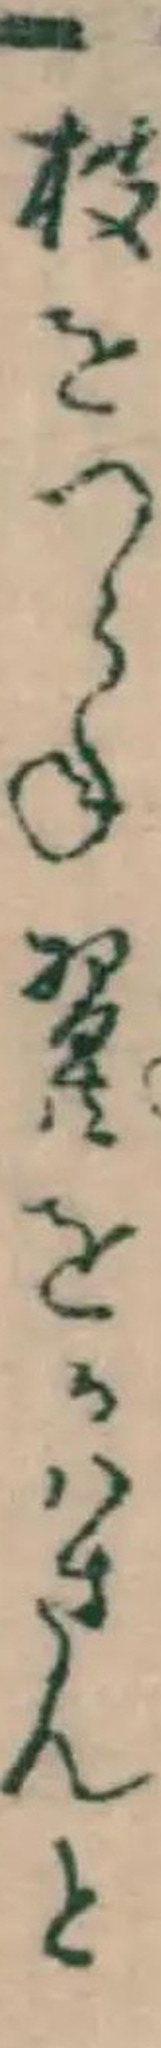枝をつらね翼をかはさんと
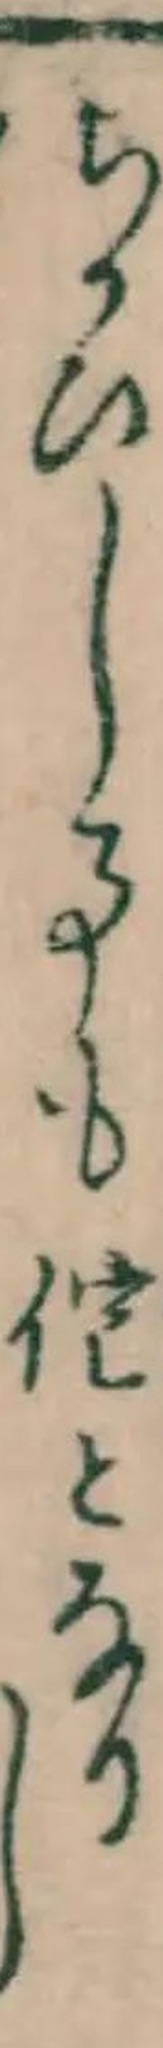ちかひし事も侘となりし
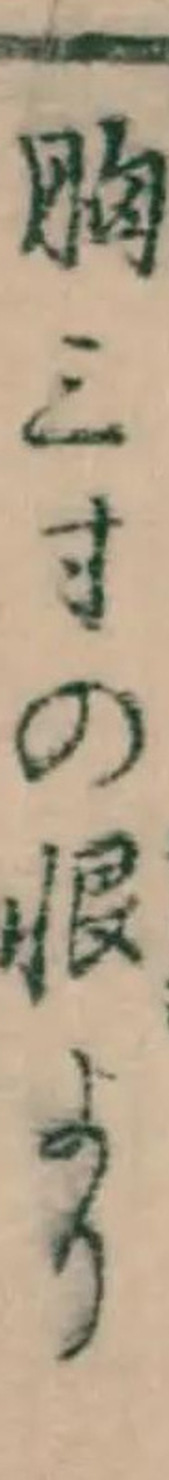胸三寸の恨より
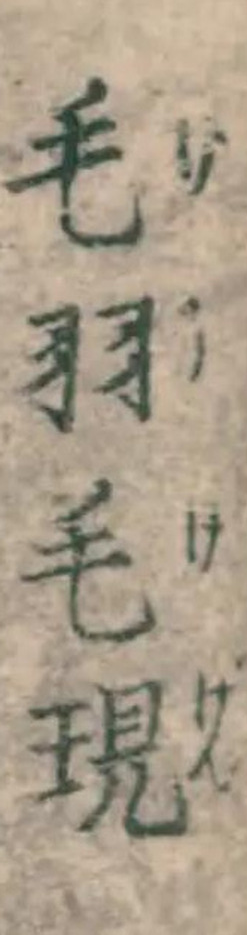毛羽毛現
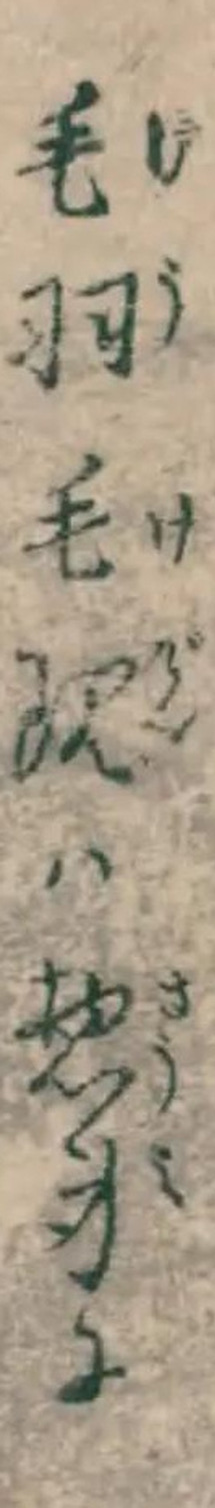毛羽毛現は総身に
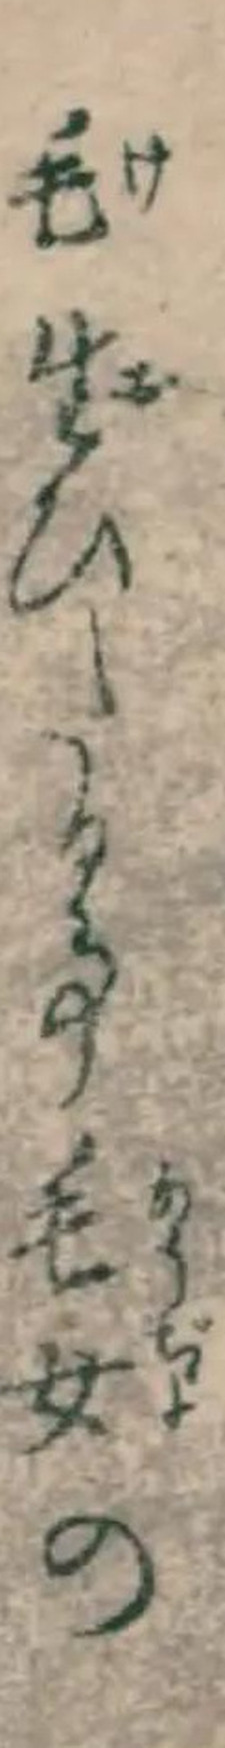毛生ひたる事毛女の
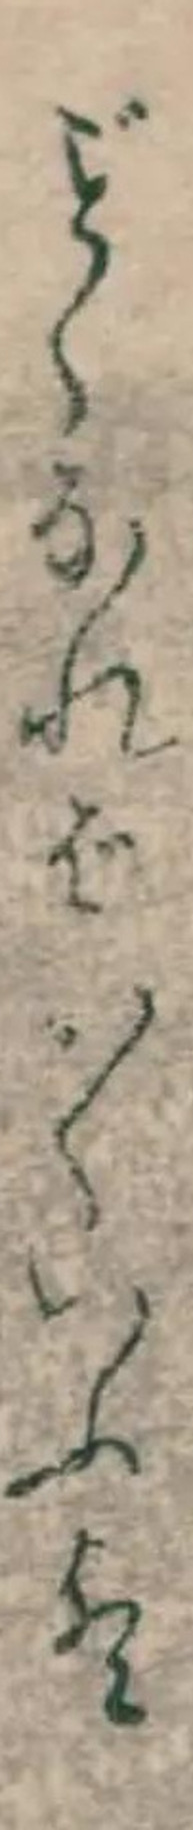ごとくなればかくいふか
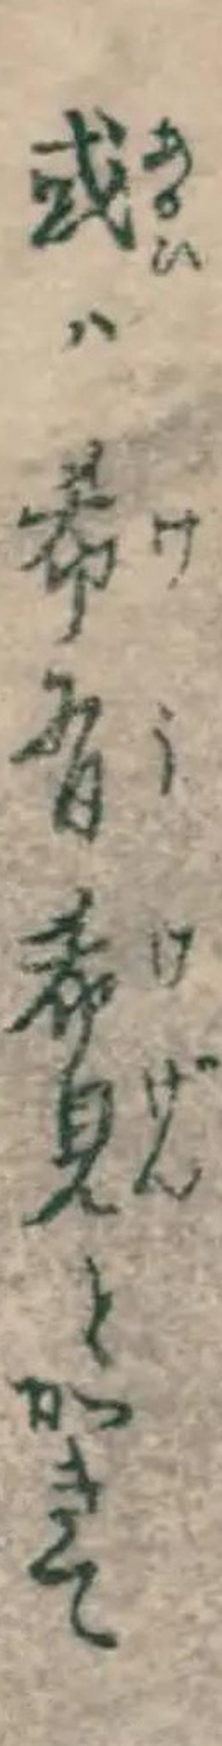或は希有希見とかきて
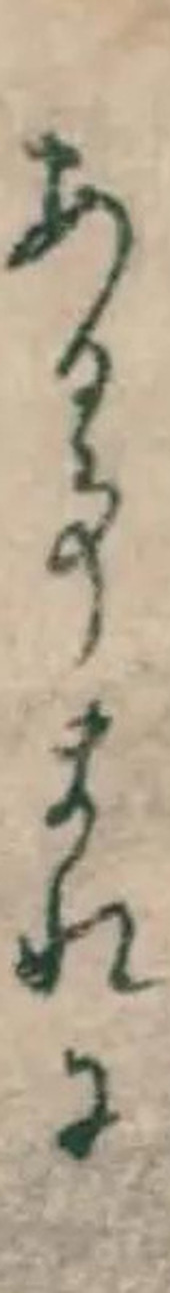ある事まれに
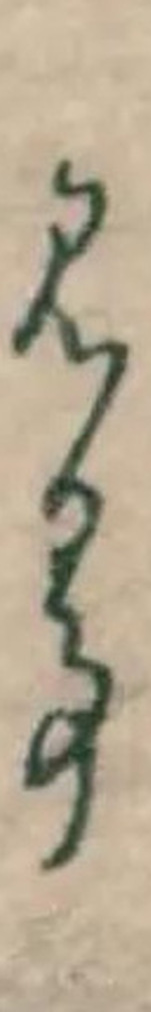見る事
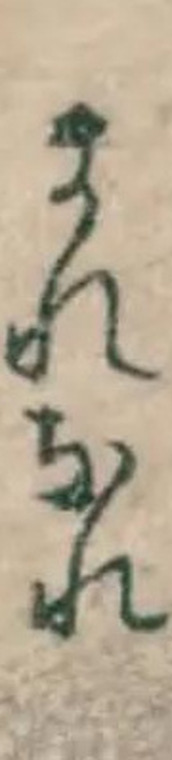まれなれ

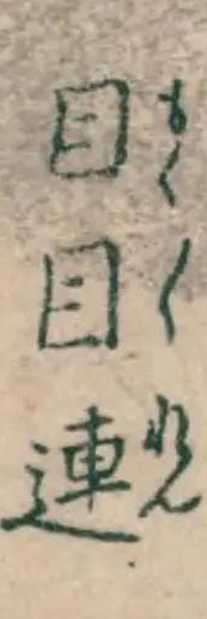目目連
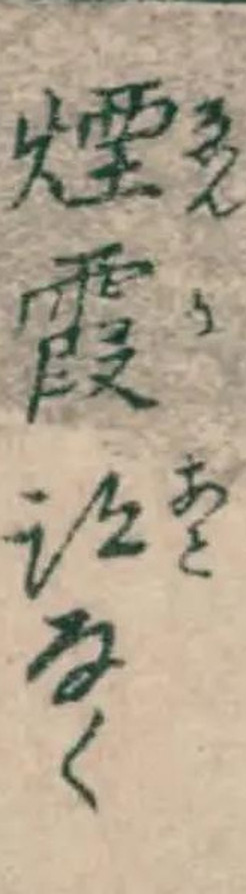煙霞跡なく
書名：百鬼夜行 3巻拾遺3巻. [2]
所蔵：国立国会図書館 National Diet Library, JAPAN
